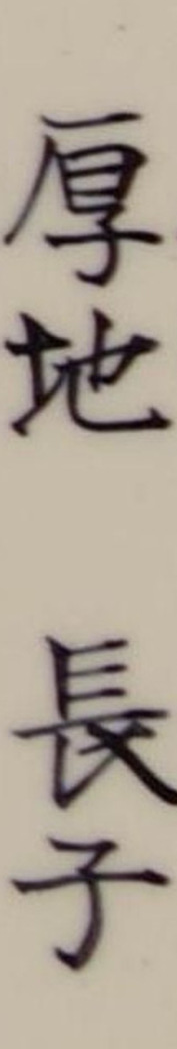厚地長子
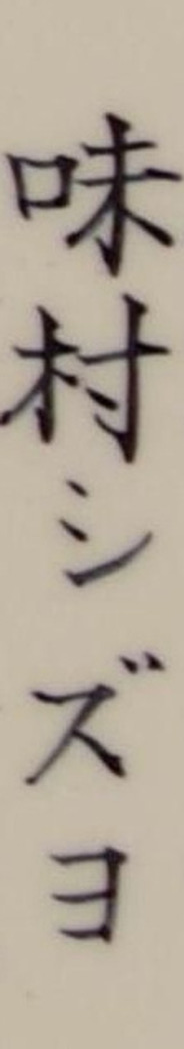味村シズヨ
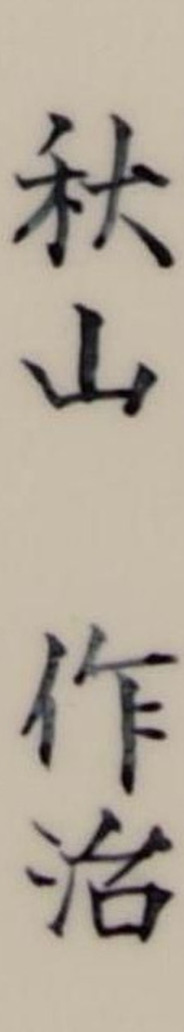秋山作治
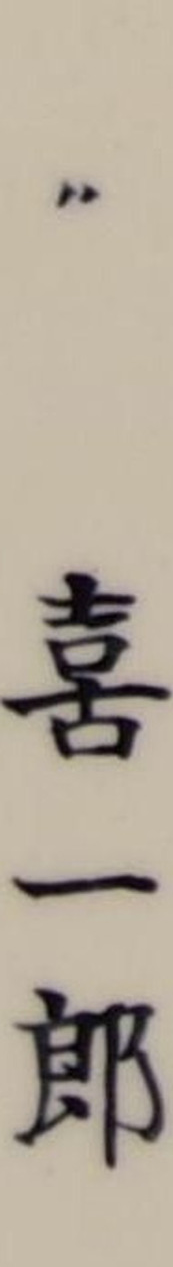喜一郎
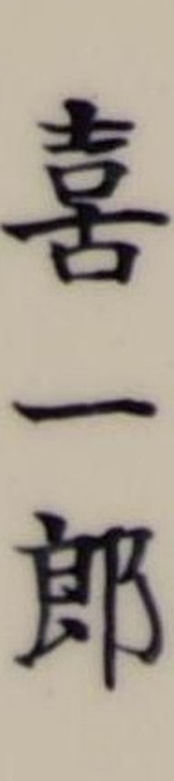喜一郎
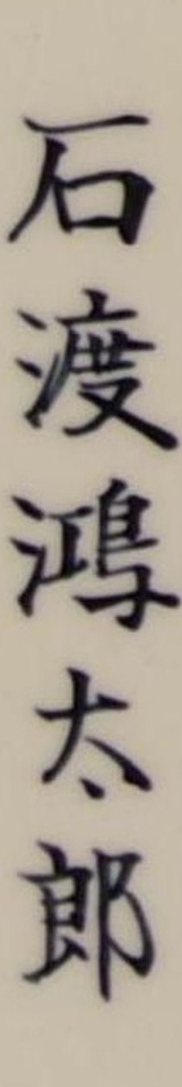石渡鴻太郎
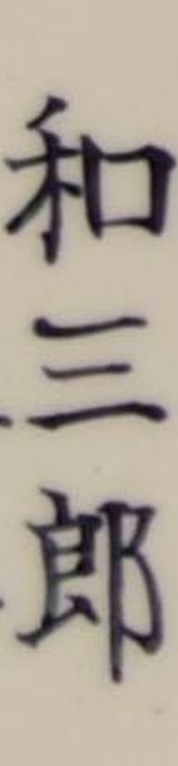和三郎

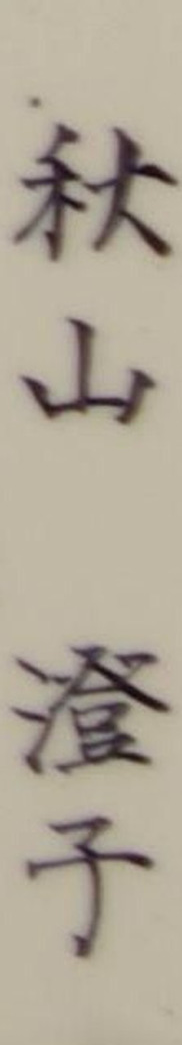秋山澄子
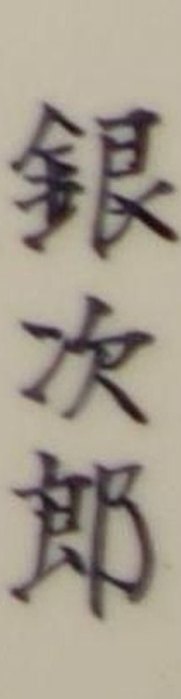銀次郎
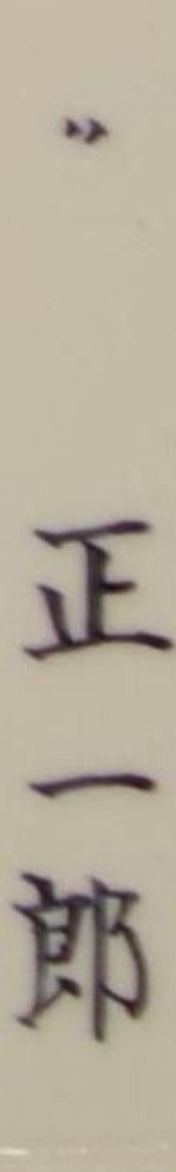正一郎
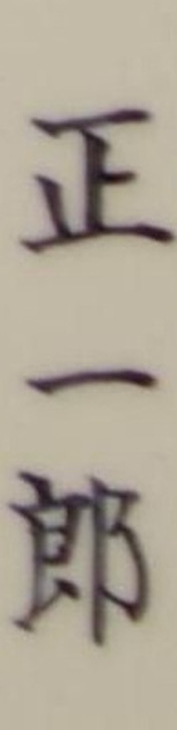正一郎
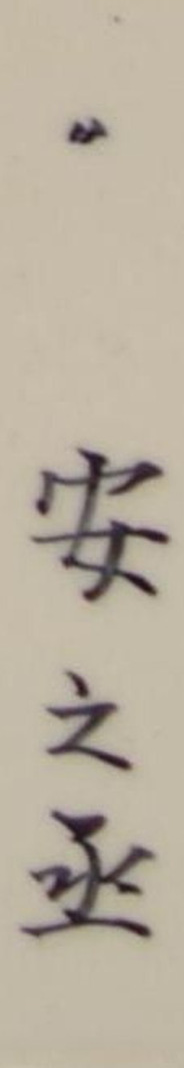安之丞
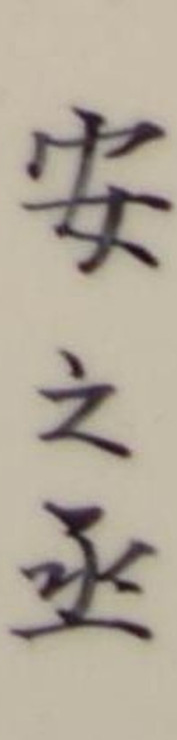安之丞
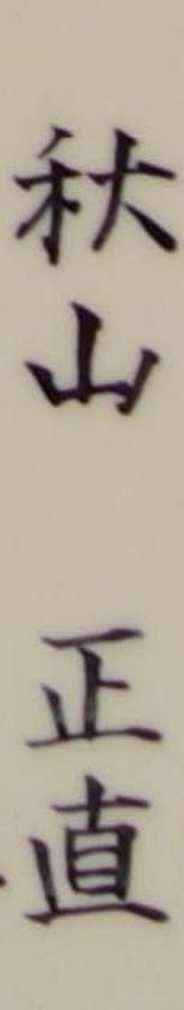秋山正直
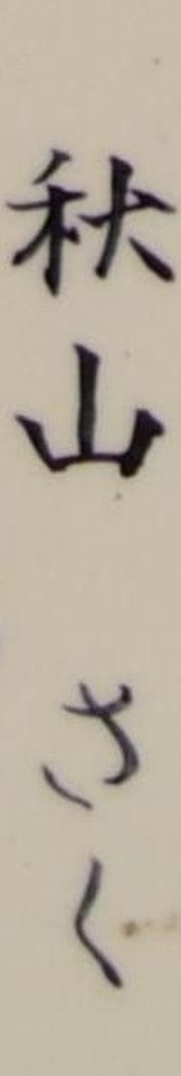秋山さく
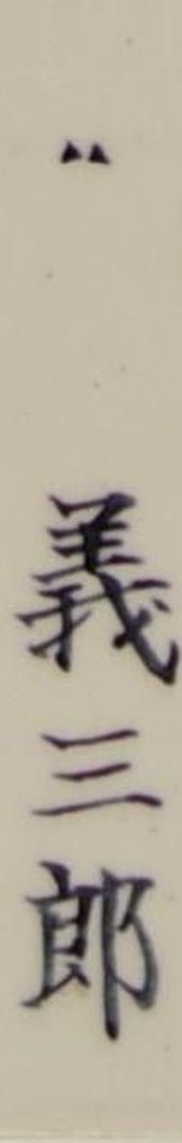義三郎
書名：E~L
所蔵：高野山金剛峯寺
